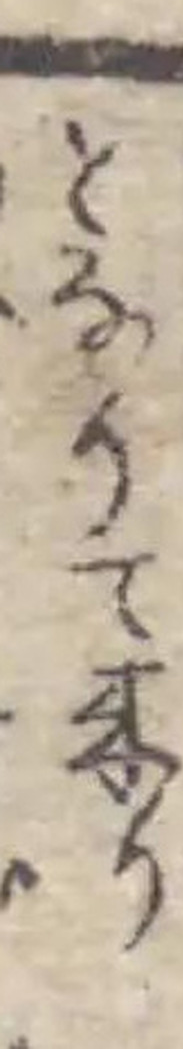となりて来り
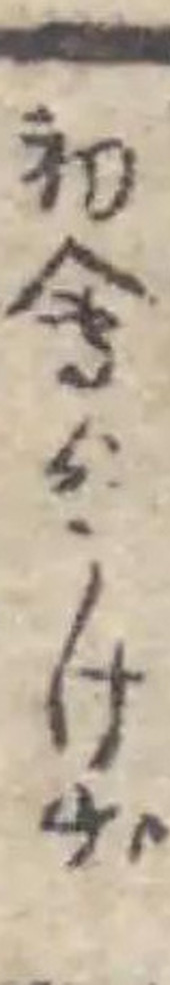初会よりうけ出
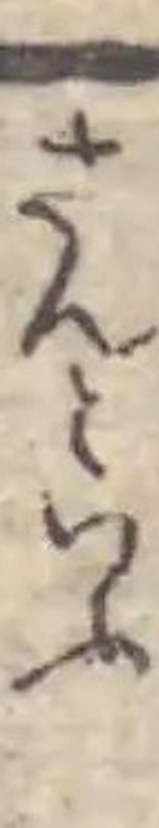さんといふ
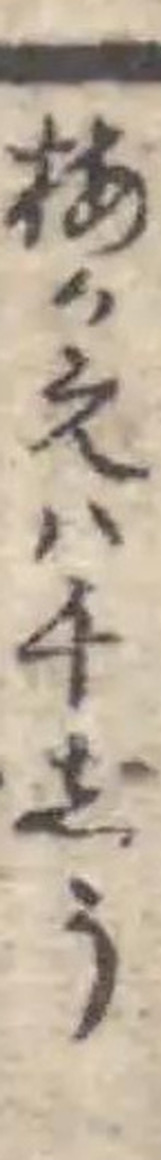梅かえは千しう
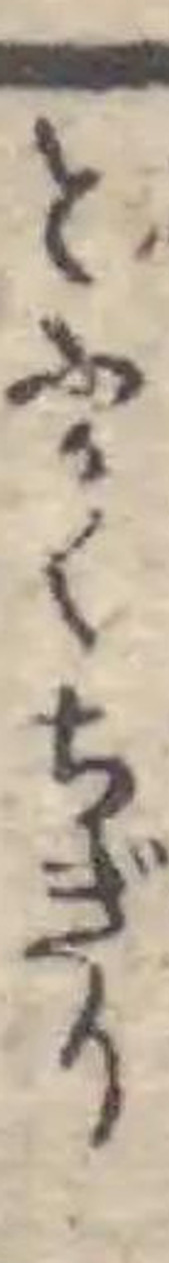とふかくちぎり
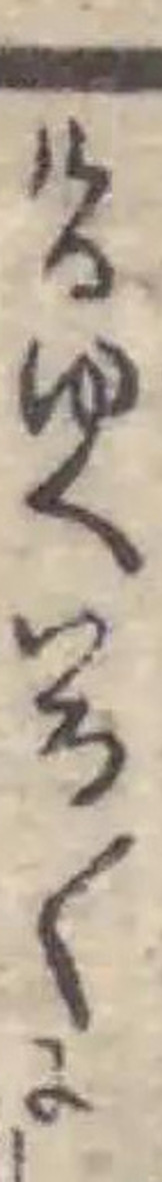けるゆへいろ〳〵に
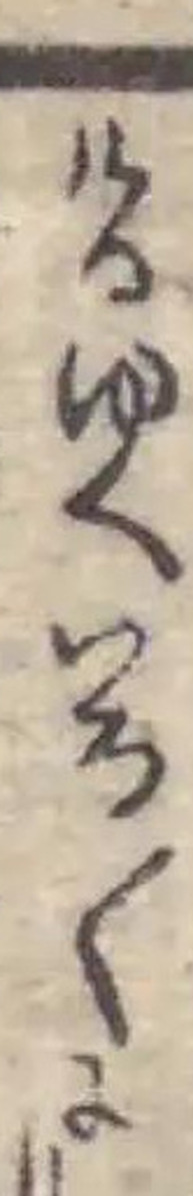けるゆへいろ〳〵に
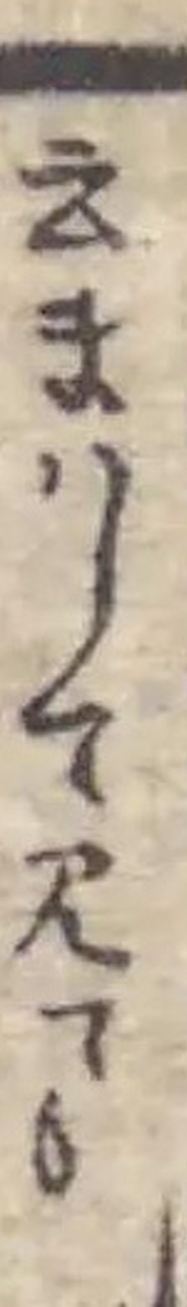云まはして見ても
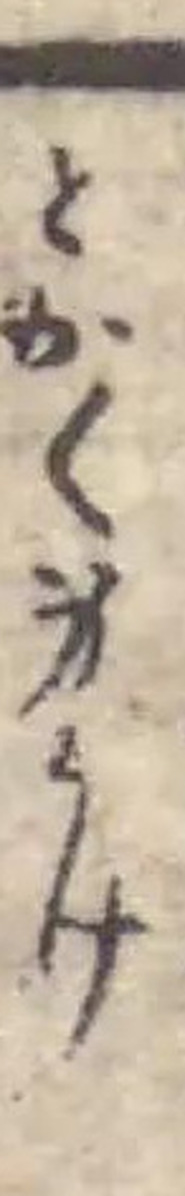とかく身うけ
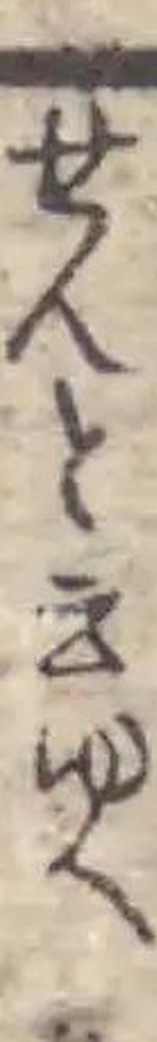せんと云ゆへ
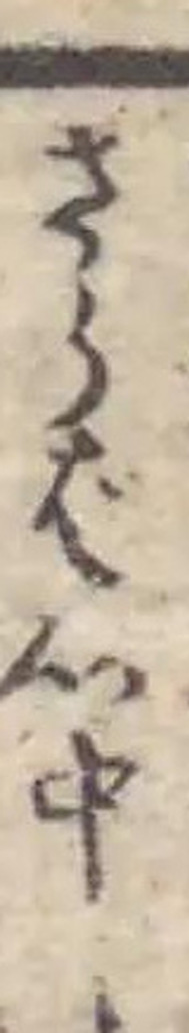さらば心中
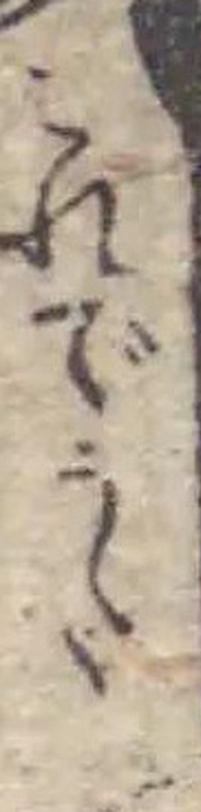これでうた
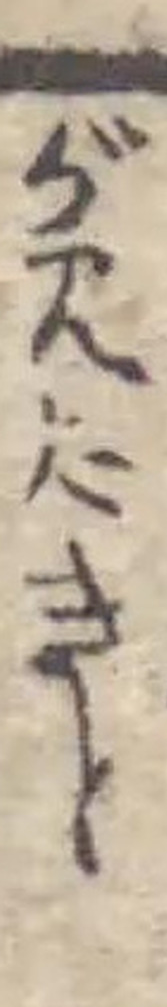が見たきと
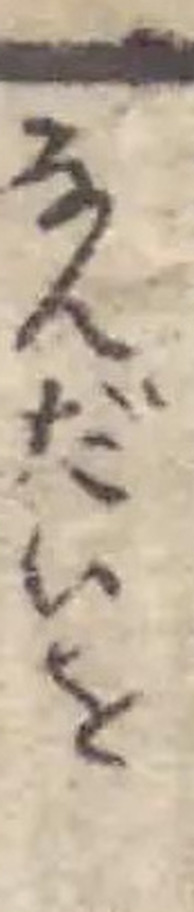なんだいを
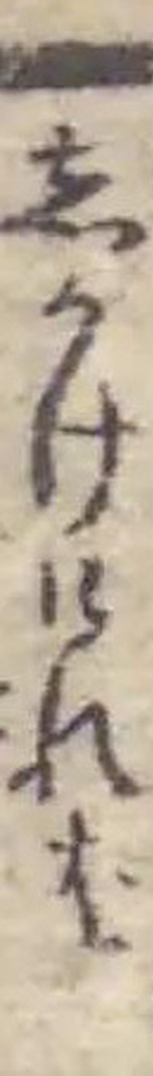しかけければ
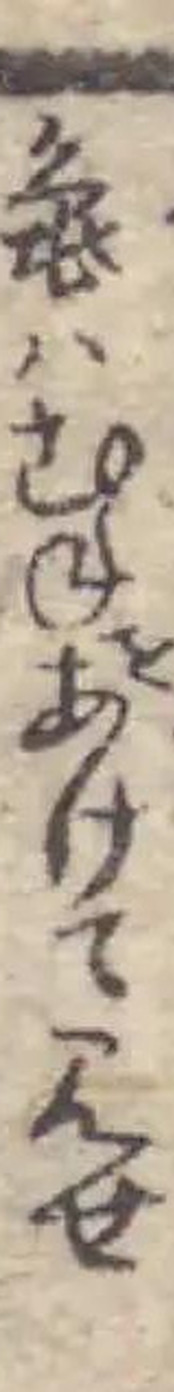亀はむねをあけて見せ
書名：見立蓬莱 : 2巻
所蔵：国立国会図書館 National Diet Library, JAPAN
